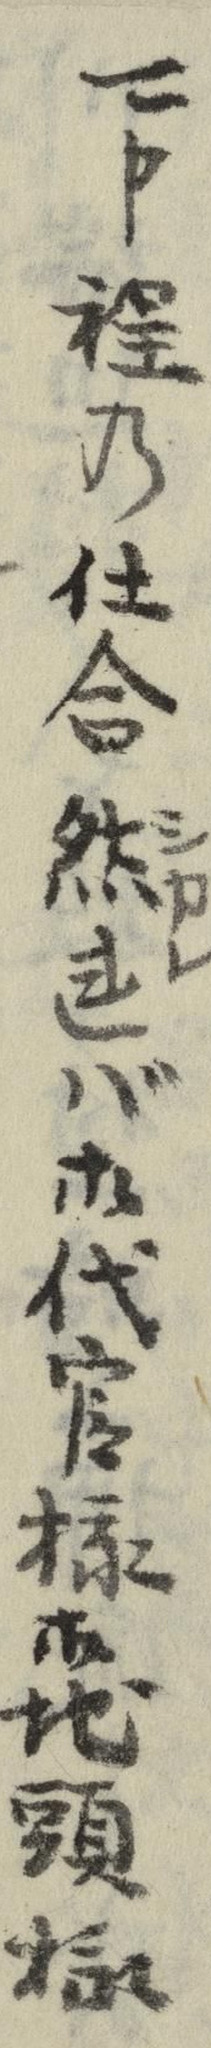可申程乃仕合然れバ御代官様御地頭様
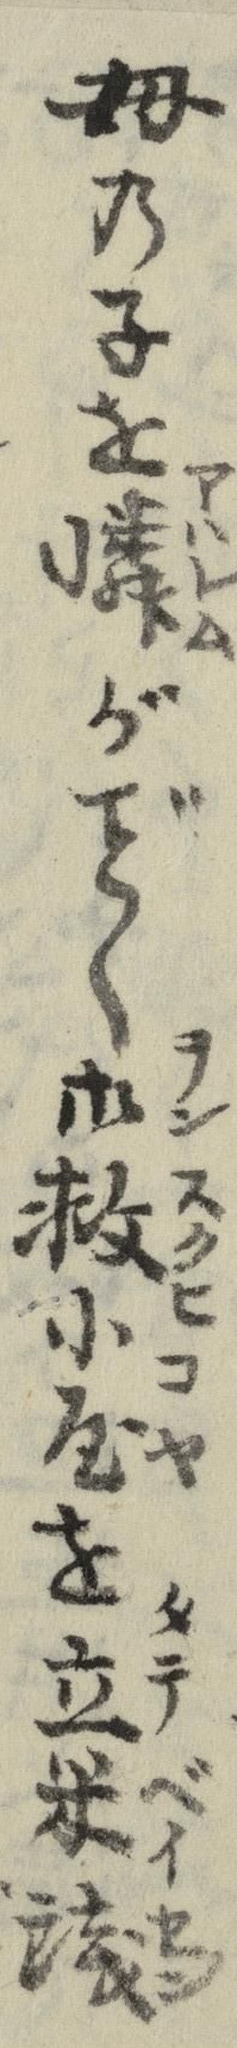母乃子を憐がごとく御救小屋を立米銭
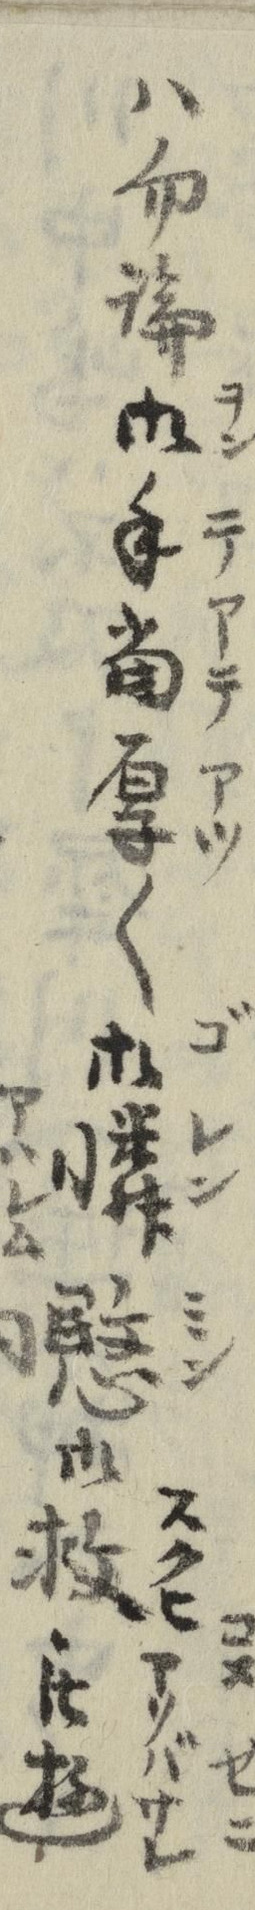ハ勿論御手当厚く御憐憫御救被遊
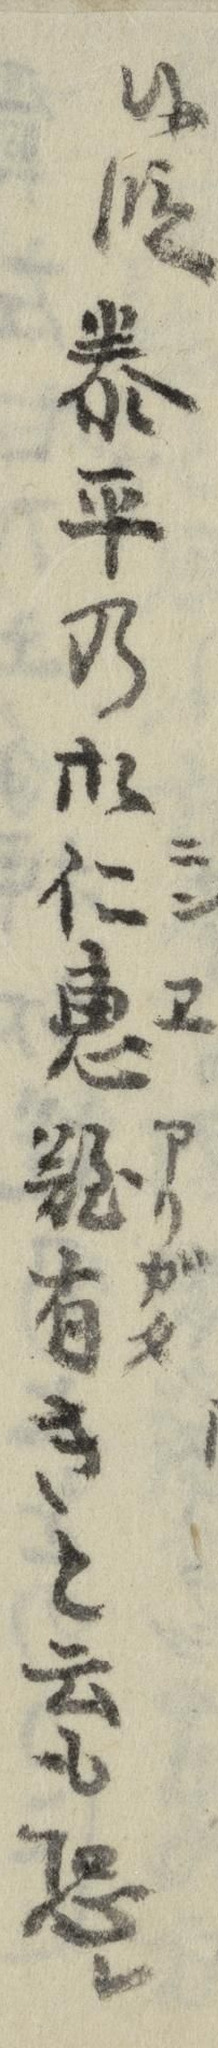候段泰平乃御仁恵難有きと云も恐レ
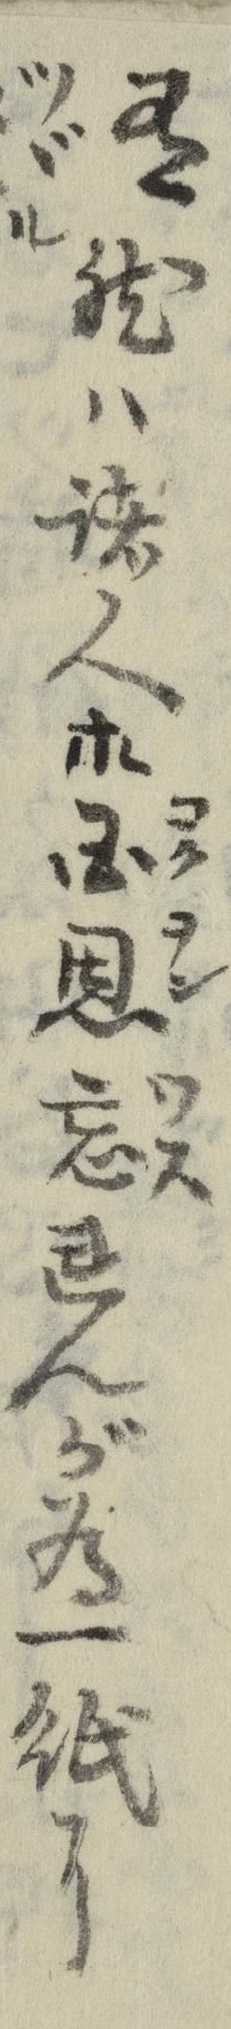有然ハ諸人御国恩忘れんが為一紙に
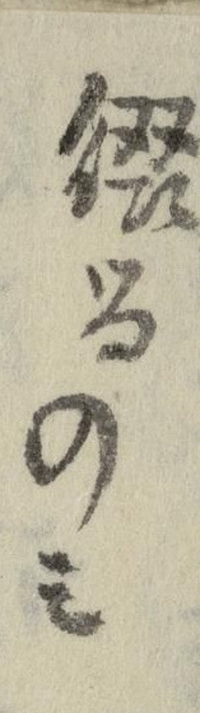綴るのミ
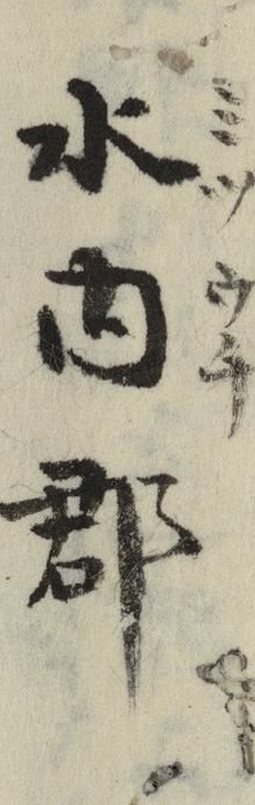水内郡
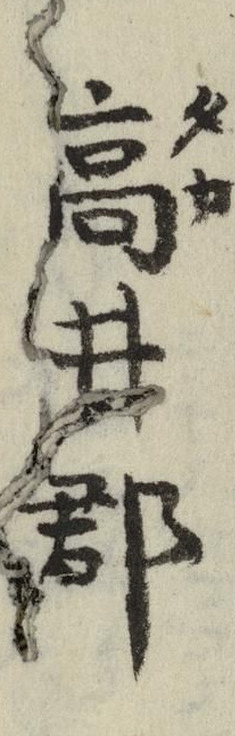高井郡
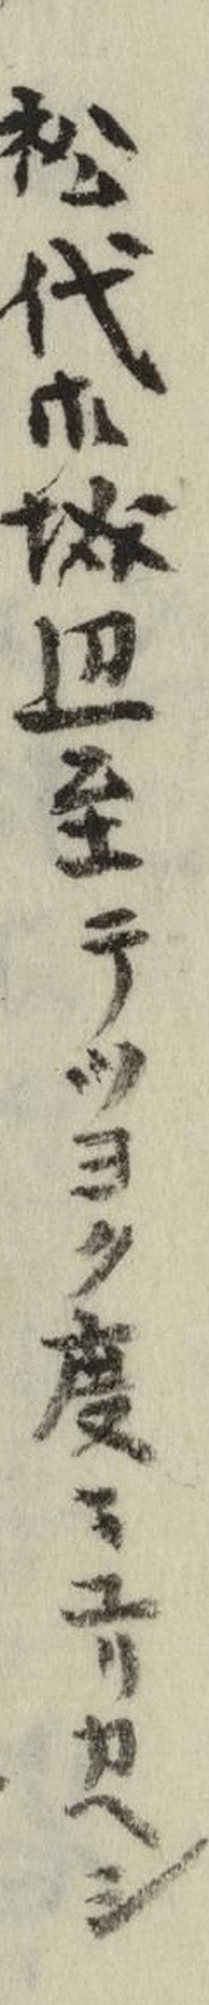埴科郡松代御城辺至テツヨク度々ユリカヘシ
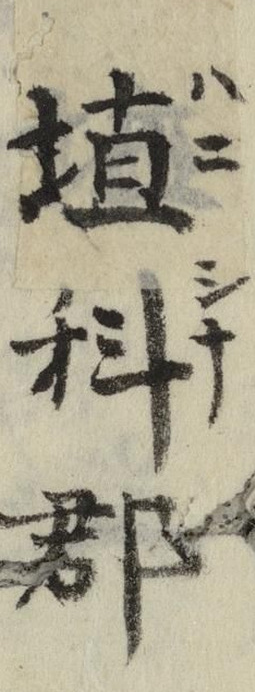更科郡
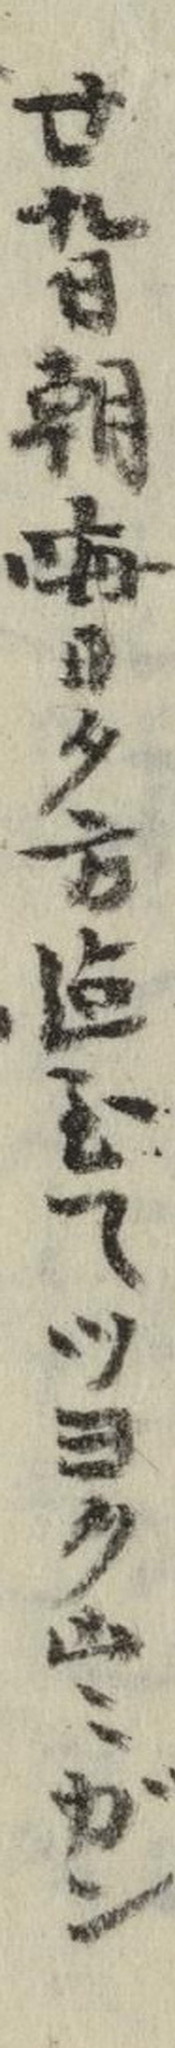廿九日朝晦日夕方迄至てツヨク山々ガン
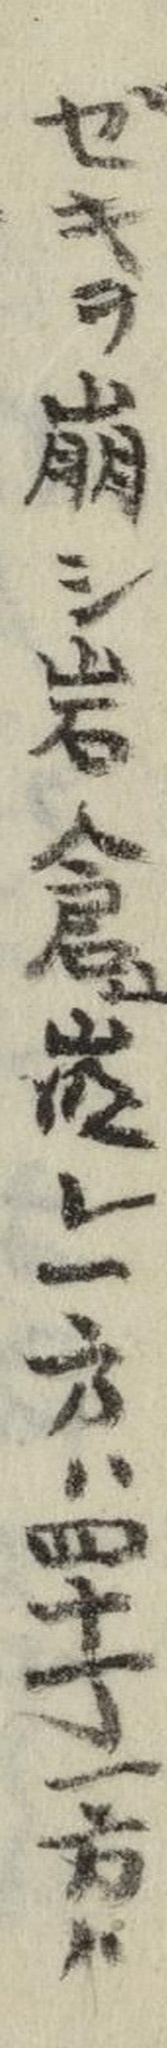ゼキヲ崩シ岩倉山崩レ一方ハ四十丁一方ハ
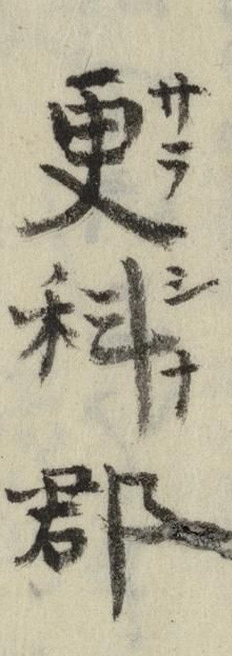更科郡
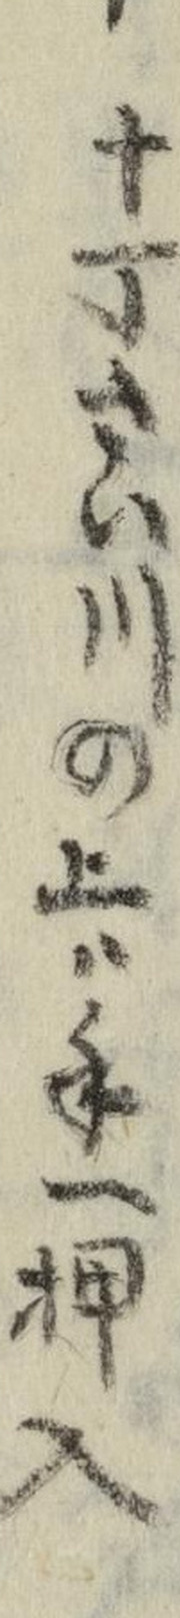十丁さい川の上ハ手へ押入
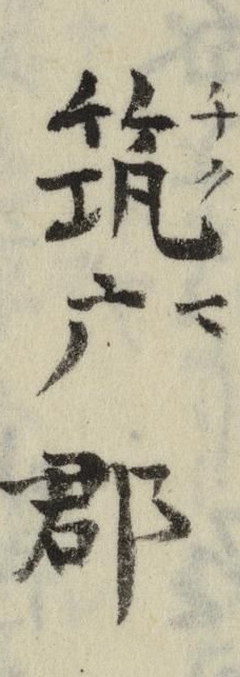筑广郡
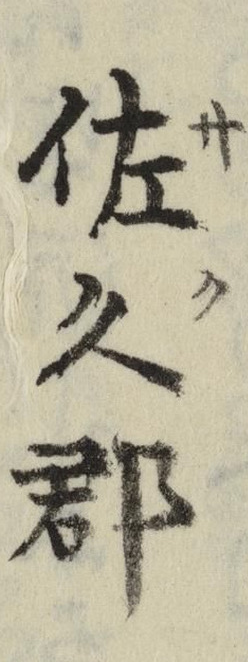佐久郡
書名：信州大地震一件之冩　丁未弘化四年三月吉日
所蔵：東京大学地震研究所図書室 Earthquake Research Institute Library, The University of Tokyo, JAPAN
